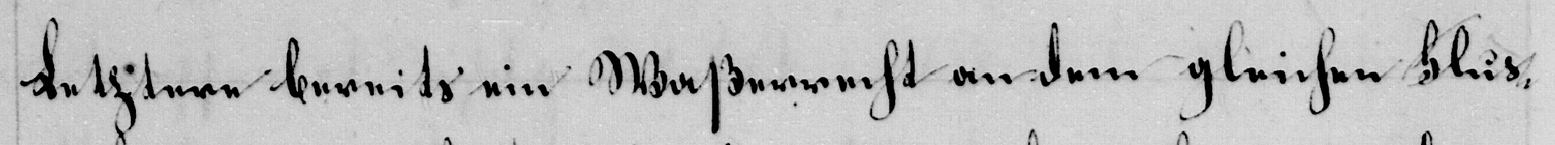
Letztere bereits ein Waßerrecht an dem gleichen Flu¬
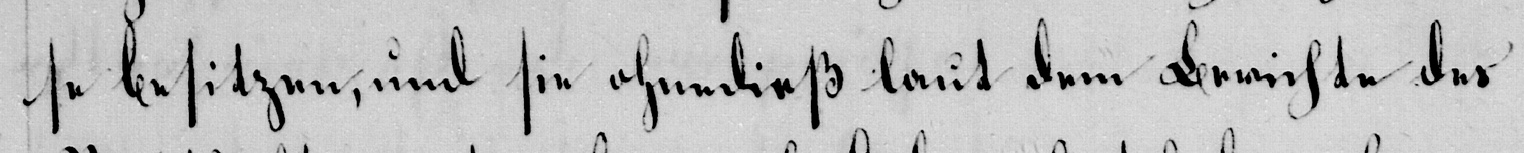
ße besitzen, und sie ohnedieß laut dem Berichte des
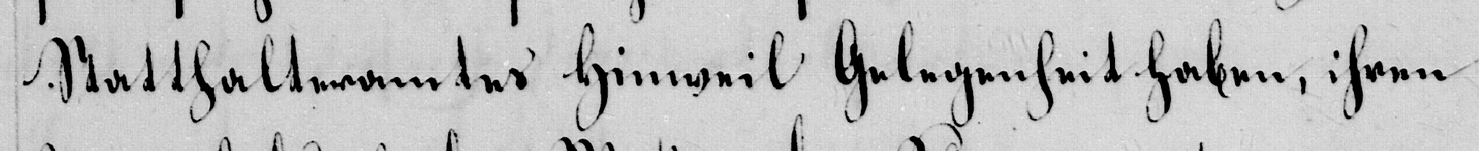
Statthalteramtes Hinweil Gelegenheit haben, ihren
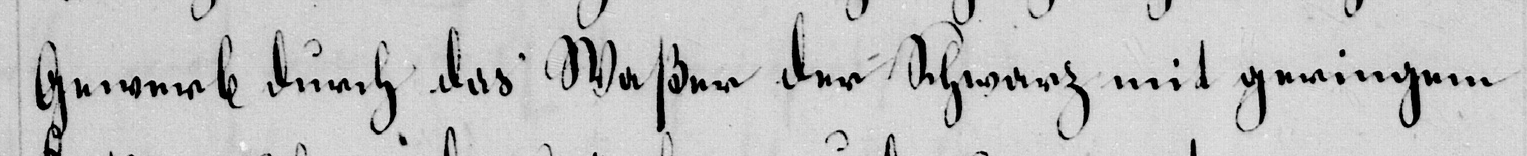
Gewerb durch das Waßer der Schwarz mit geringem
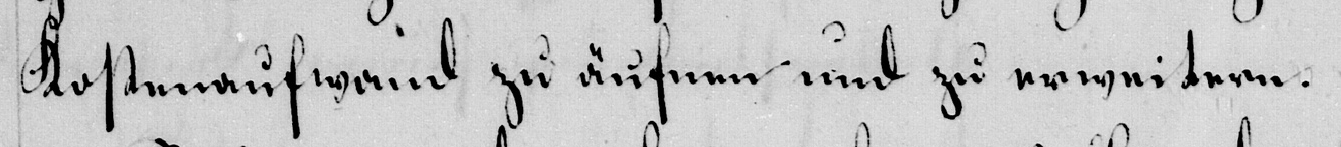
Kostenaufwand zu äufnen und zu erweitern.
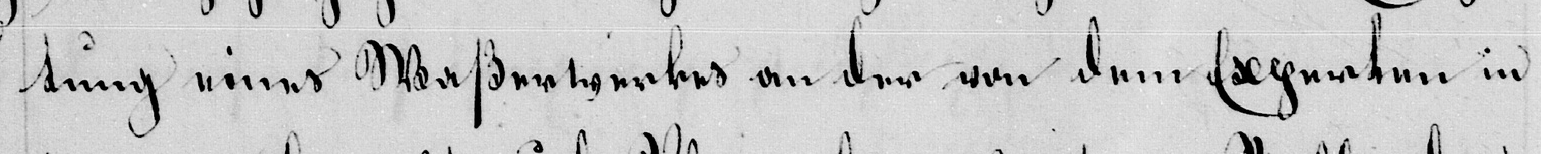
tung eines Waßerwerkes an der von dem Experten in
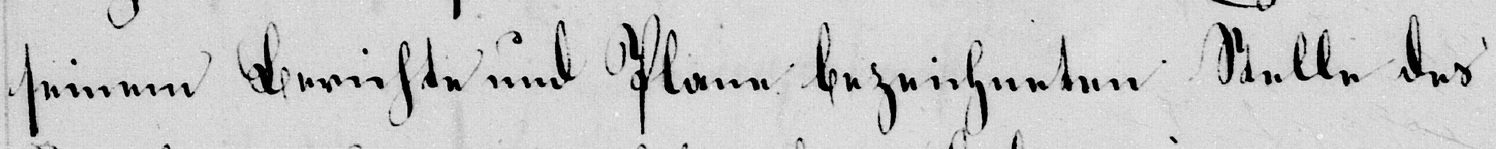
seinem Berichte und Plane bezeichneten Stelle des
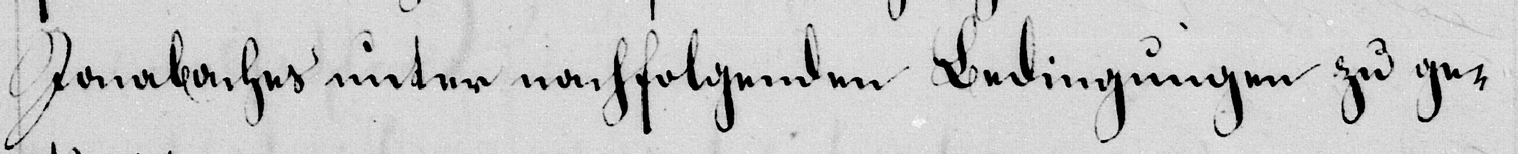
Jonabaches unter nachfolgenden Bedingungen zu ge¬
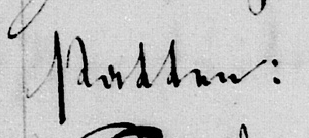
statten:
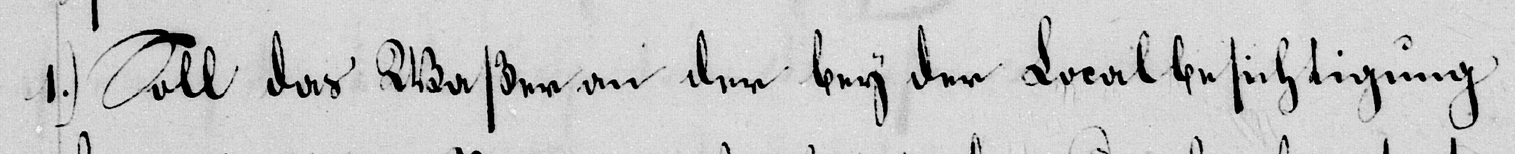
1.) Soll das Waßer an der bey der Localbesichtigung
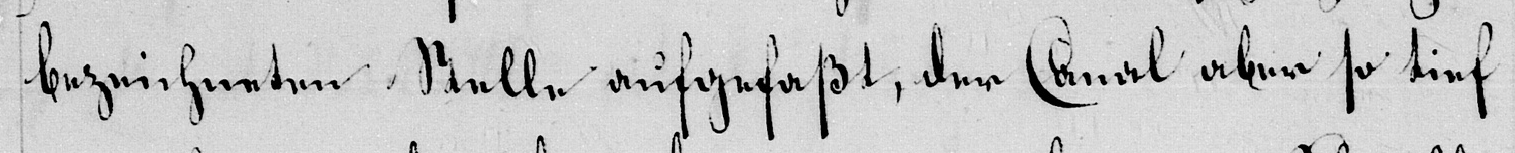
bezeichneten Stelle aufgefaßt, der Canal aber so tief
